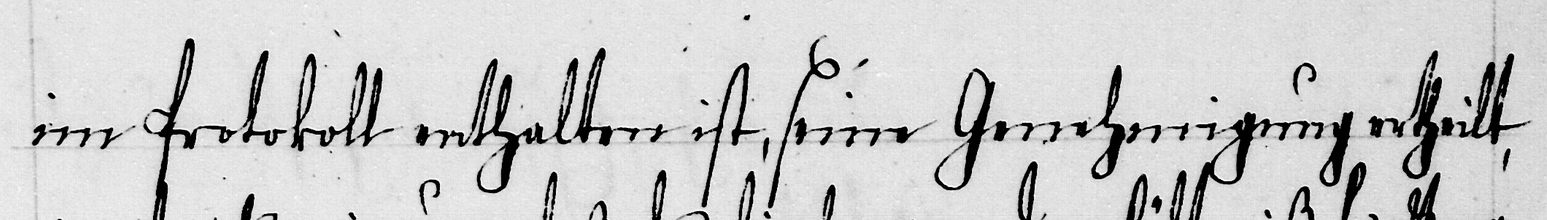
im Protokoll enthalten ist, seine Genehmigung ertheilt,
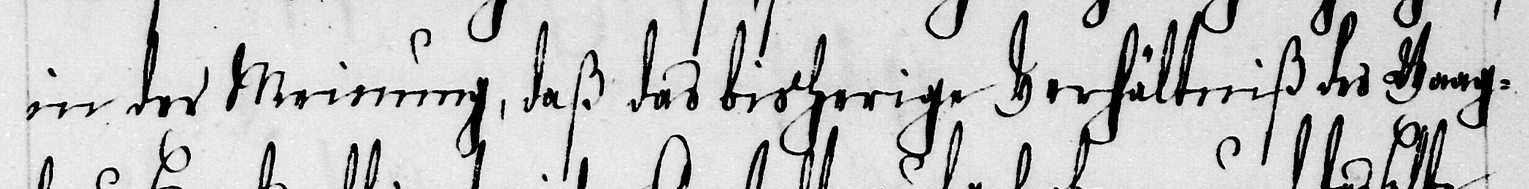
in der Meinung, daß das bisherige Verhältniß des Waag¬
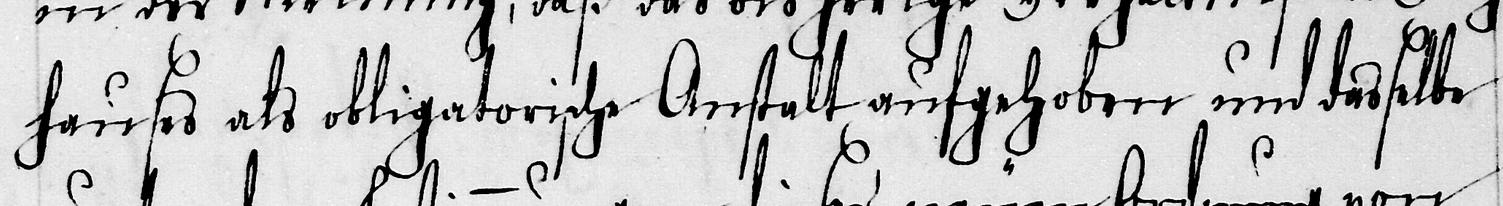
hauses als obligatorische Anstalt aufgehoben und dasselbe
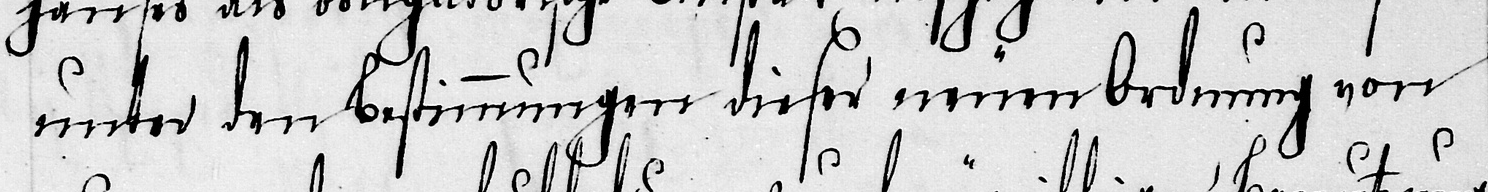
unter den Bestimmungen dieser neuen Ordnung von
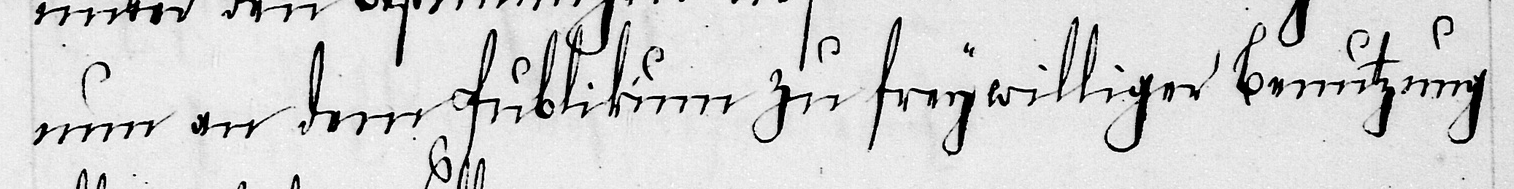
nun an dem Publikum zu freywilliger Benutzung
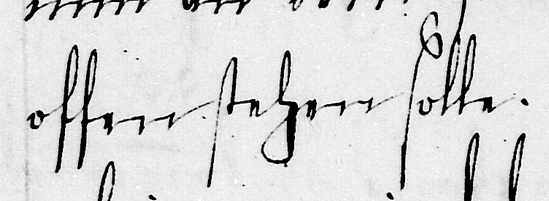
offen stehen soll¬
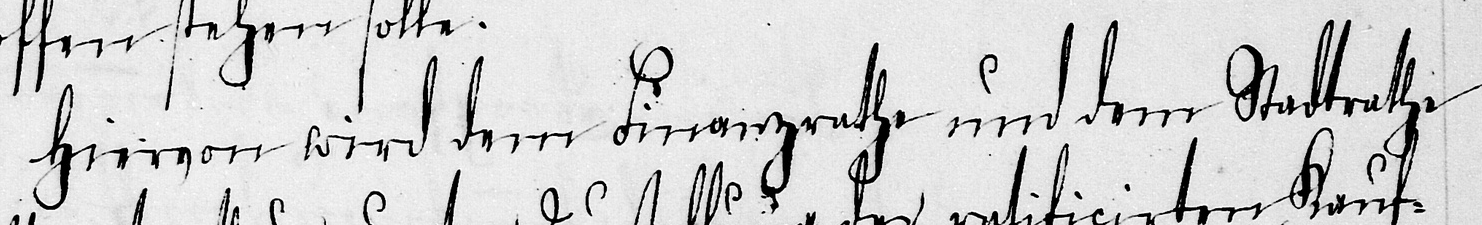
Hiervon wird dem Finanzrathe und dem Stadtrathe
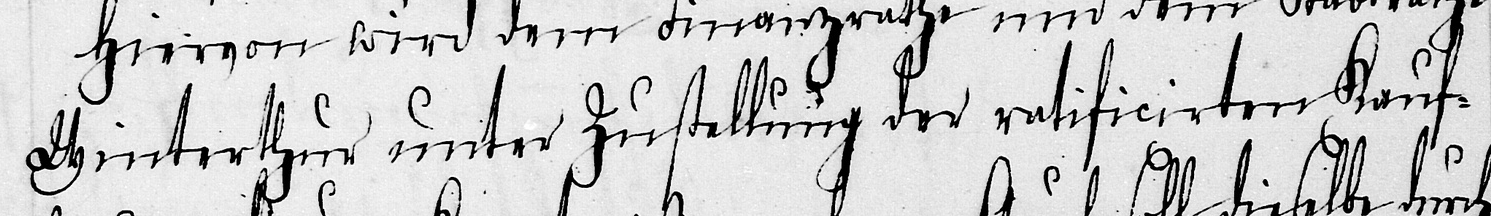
Winterthur unter Zustellung der ratificirten Kauf¬
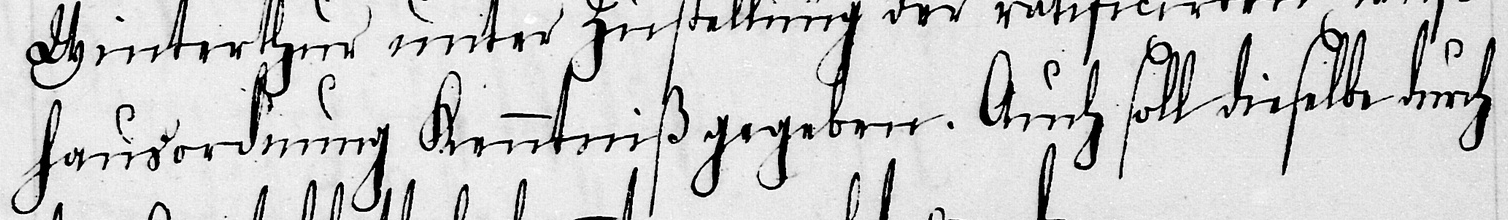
hausordnung Kenntniß gegeben. Auch soll dieselbe dur¬
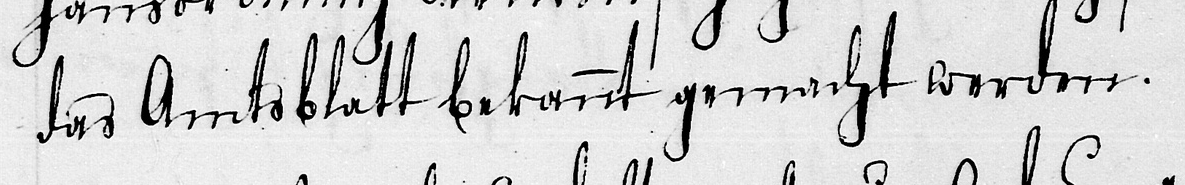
das Amtsblatt bekannt gemacht werden.
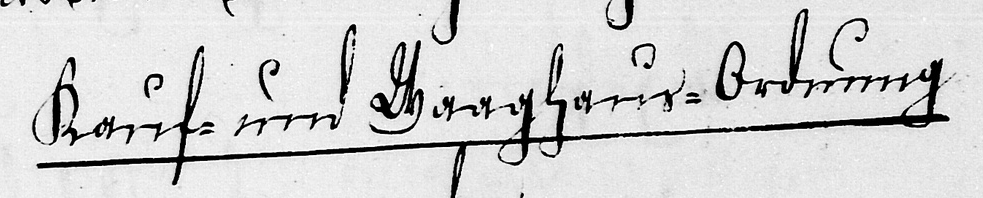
Kauf- und Waaghaus-Ordnung
